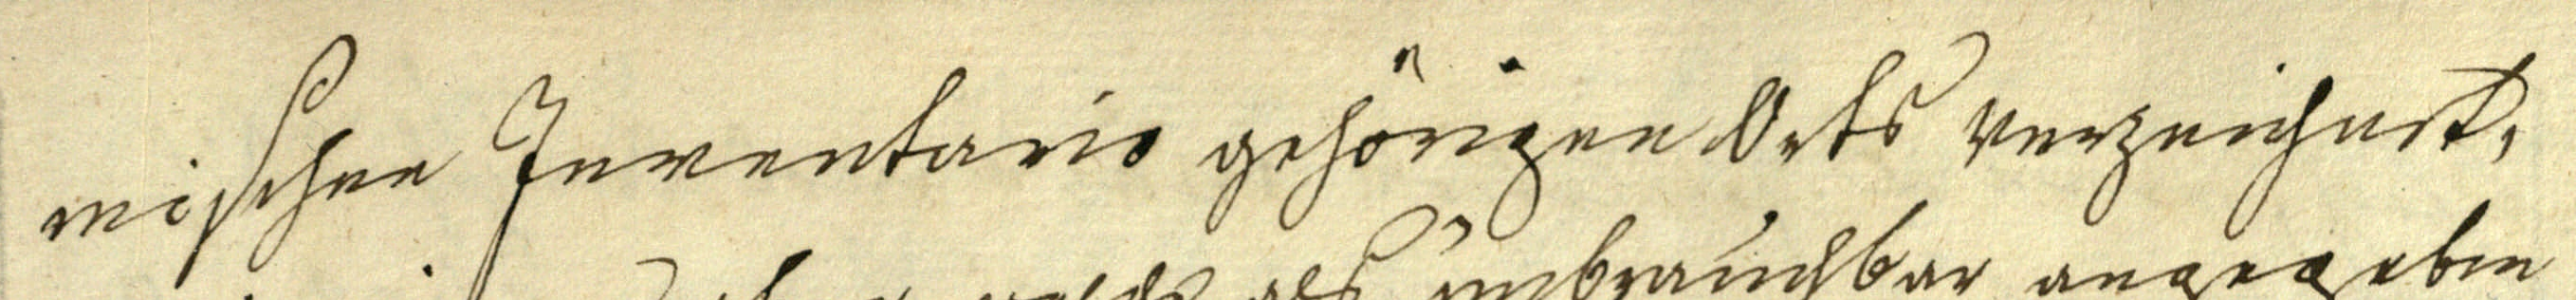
mischen Inventario gehörigen Orts verzeichnet,
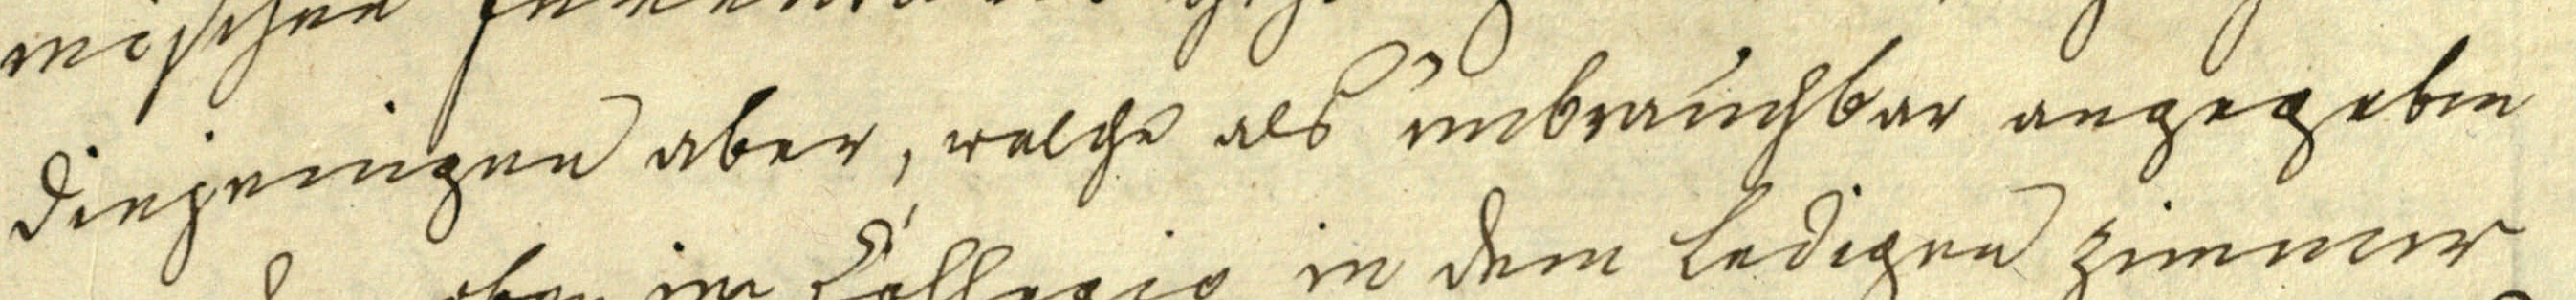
diejenigen aber, welche als unbrauchbar angegeben
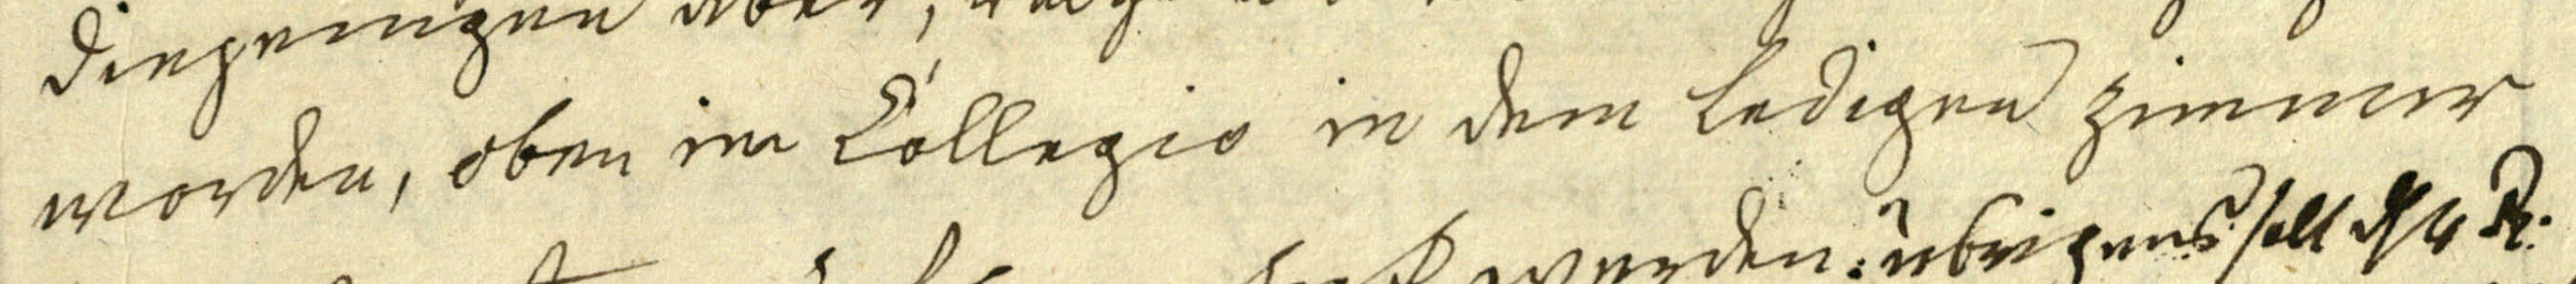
worden, oben im Collegio in dem ledigen Zimmer
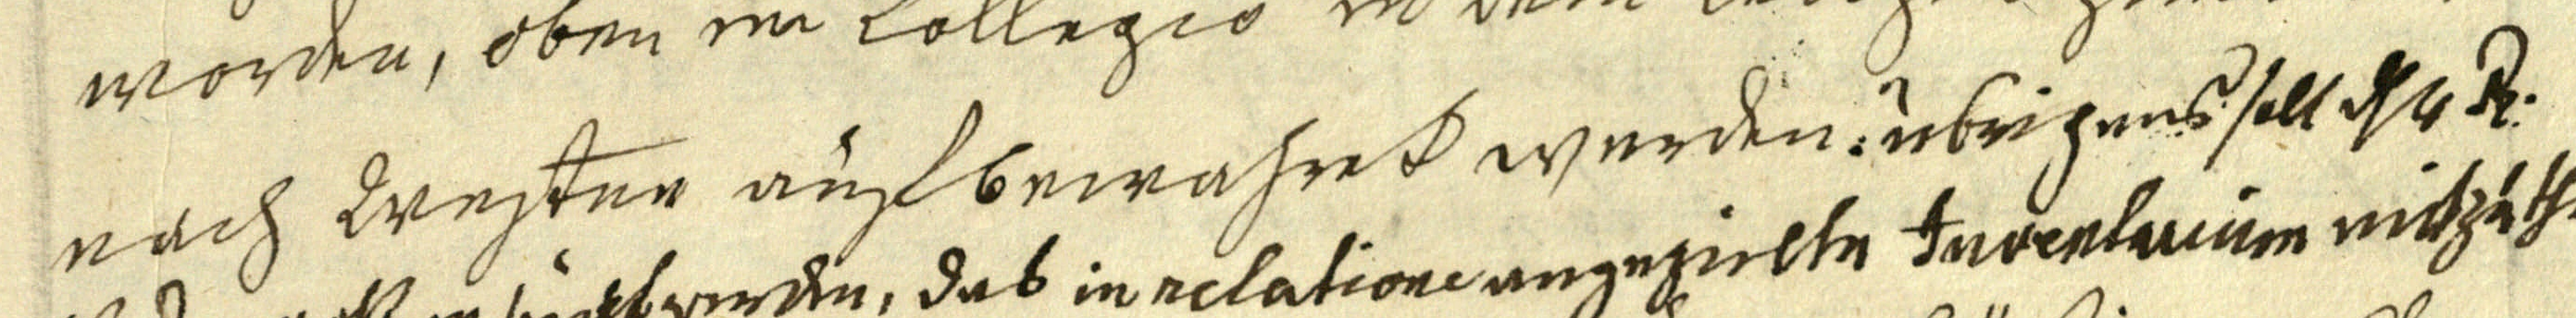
nach Westen aufbewahret werden. übrigens soll dh Pr.
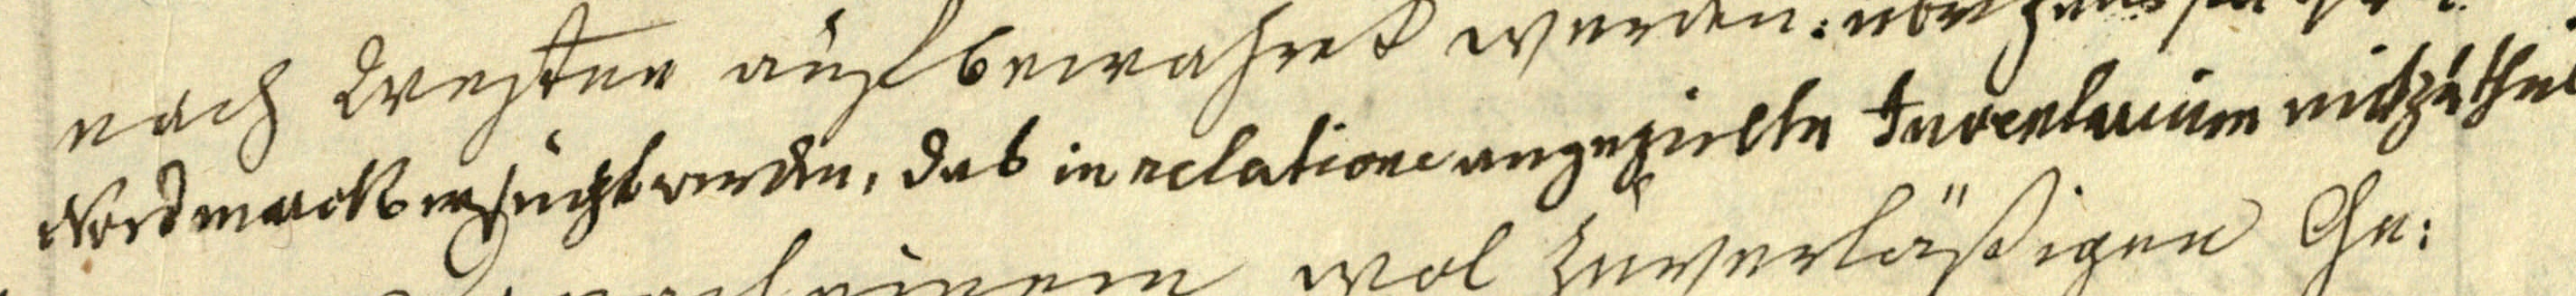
Nordmarck ersucht werden, das in relation angezielte Inventarium mitzutheilen
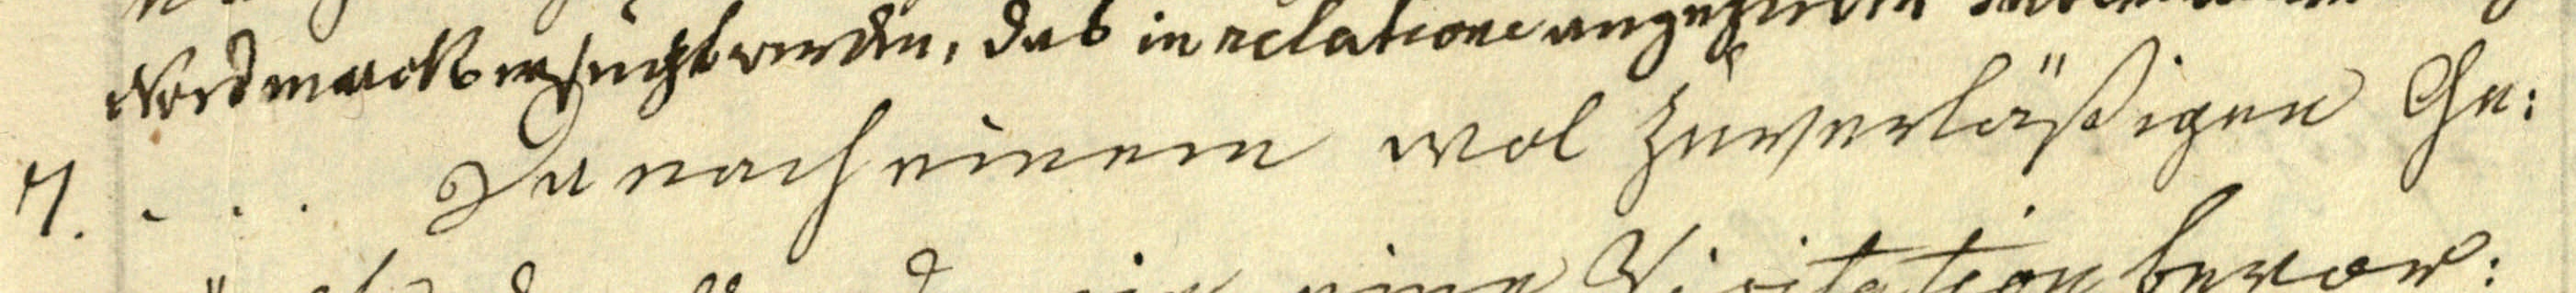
7. Da nach einem wol zuverläßigen Ge¬
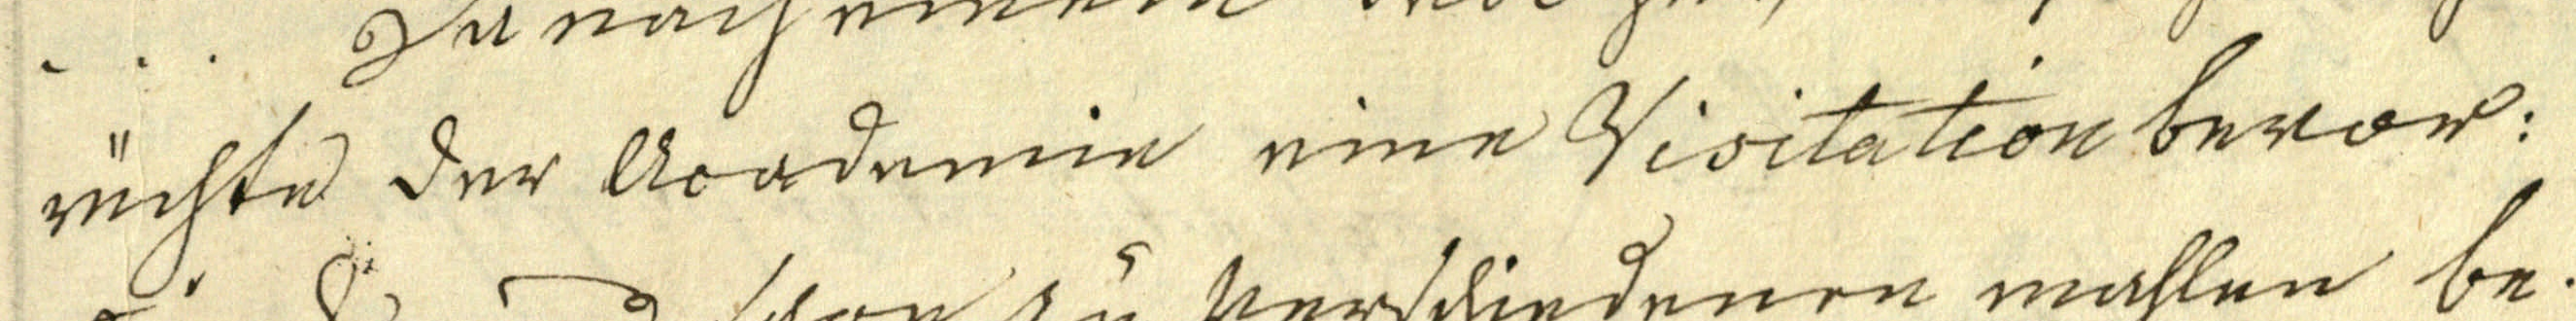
rüchte der Academie eine Visitation bevor¬
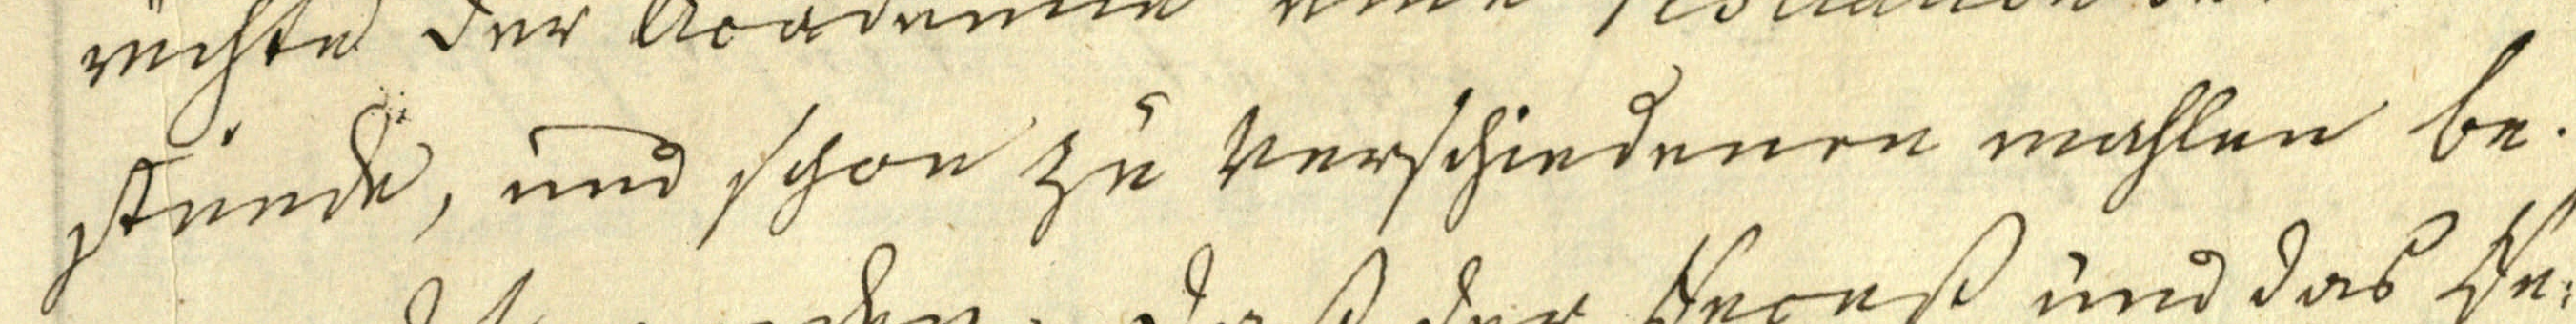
stünde, und schon zu verschiedenen mahlen be¬
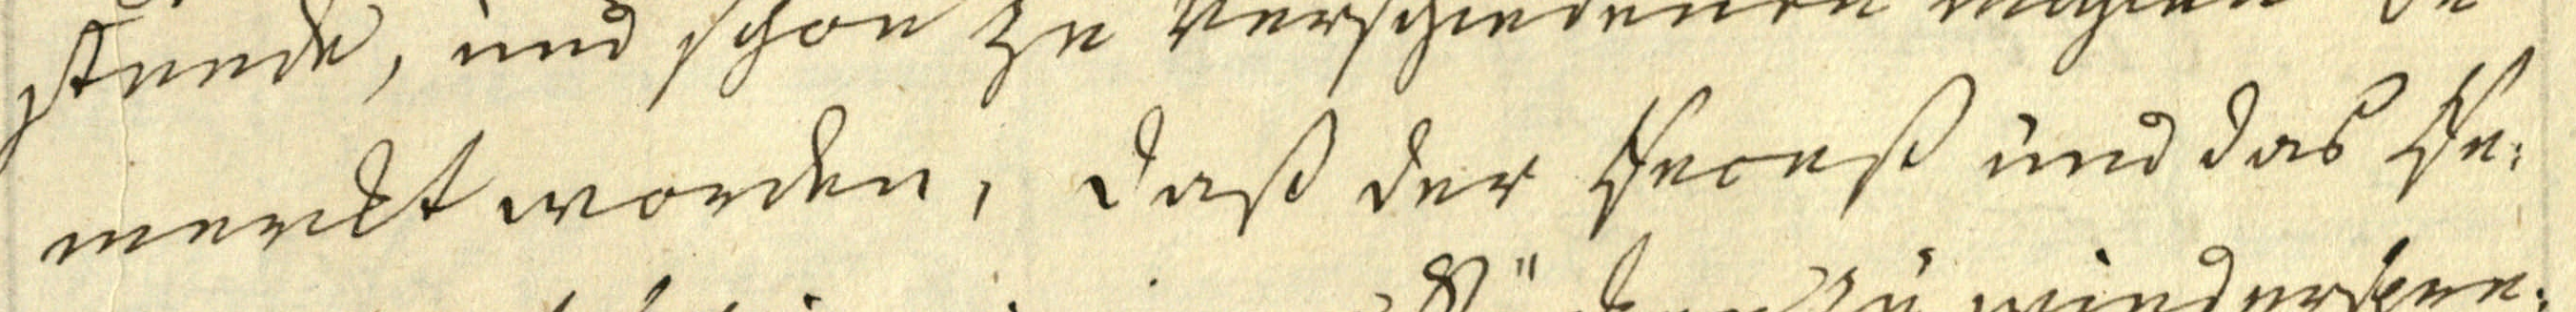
merkt worden, daß der Receß und das Re¬
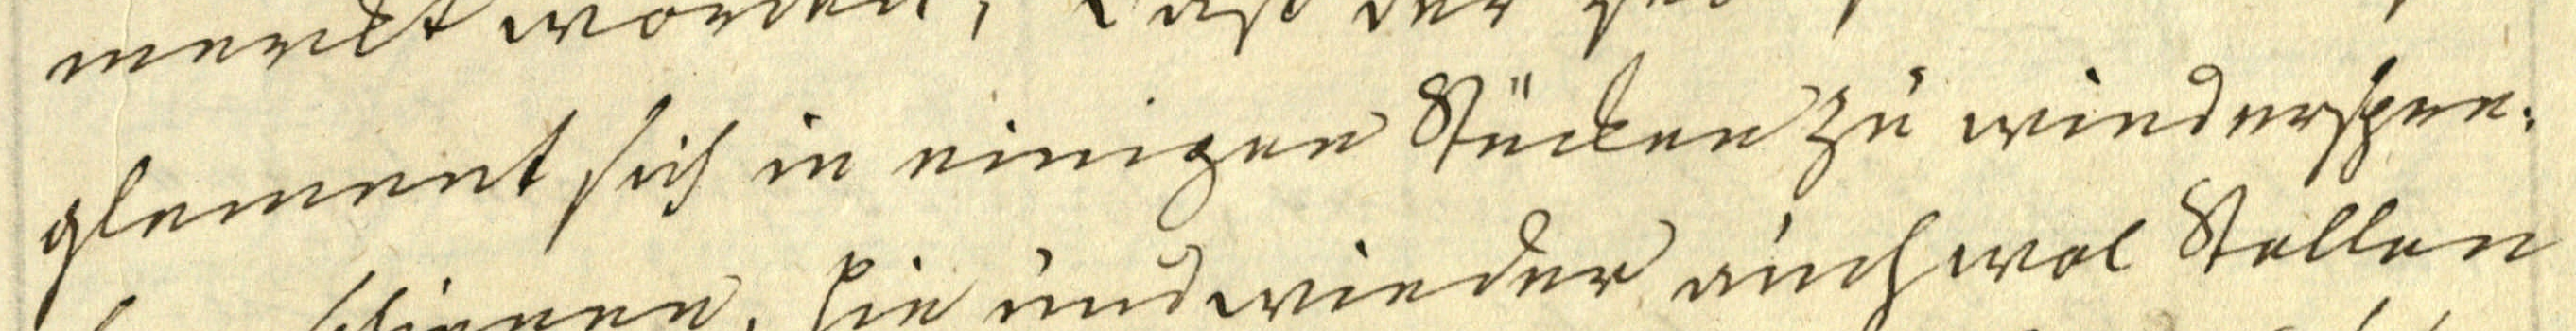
glement sich in einigen Stücken zu wiederspre¬
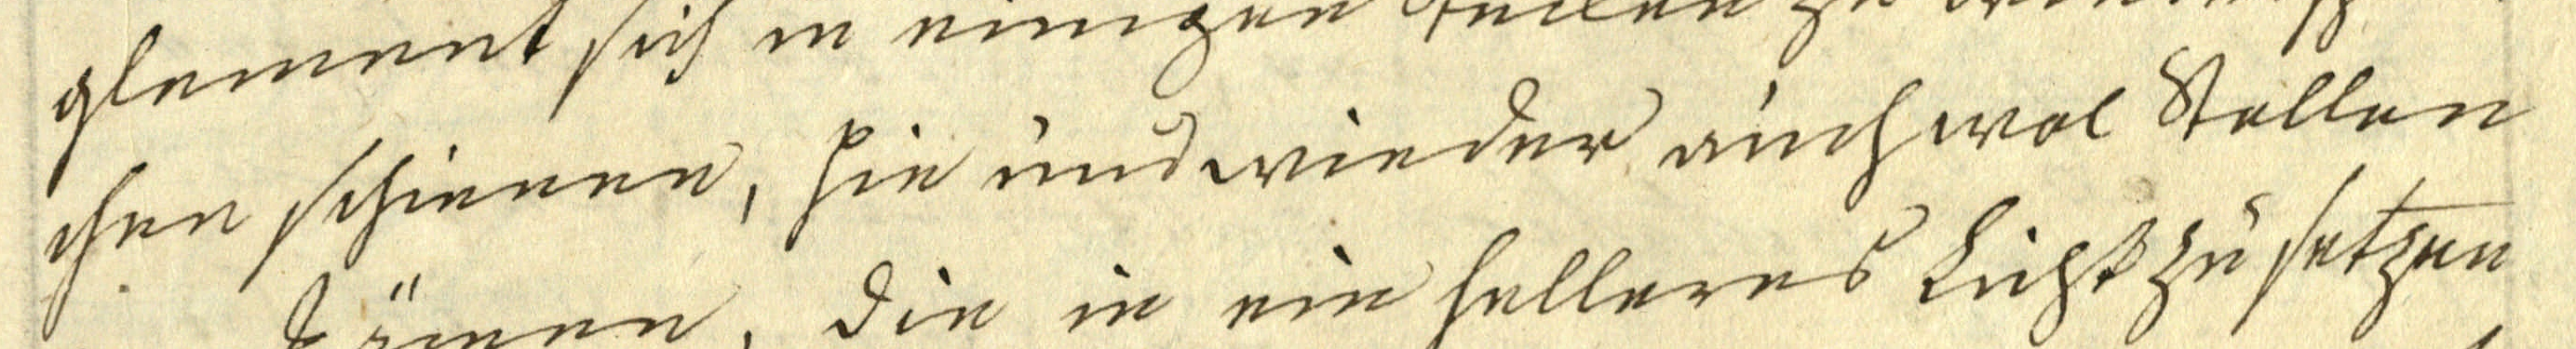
chen schienen, hin und wieder auch wol Stellen
